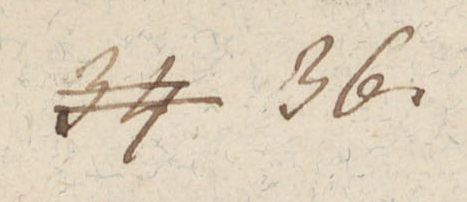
34 36.
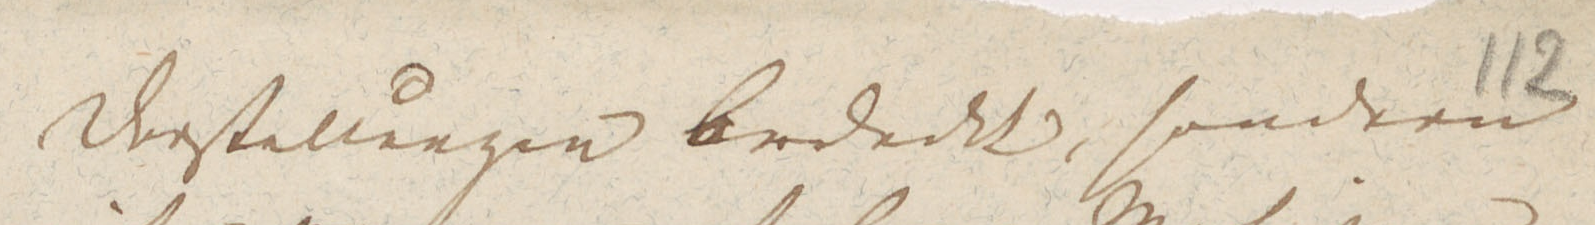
Darstellungen bedeckt, sondern
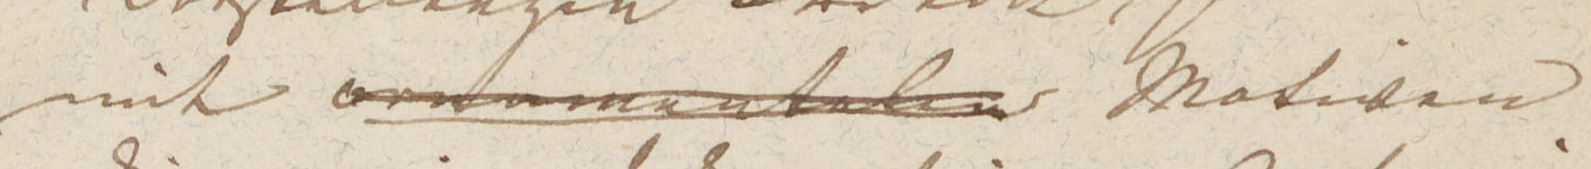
mit ornamentalen Motiven
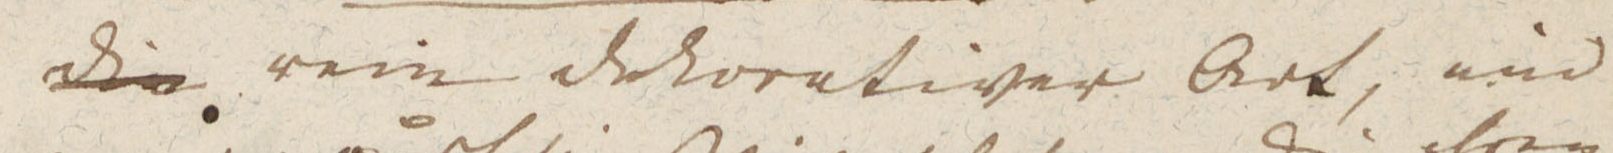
die rein dekorativer Art, und
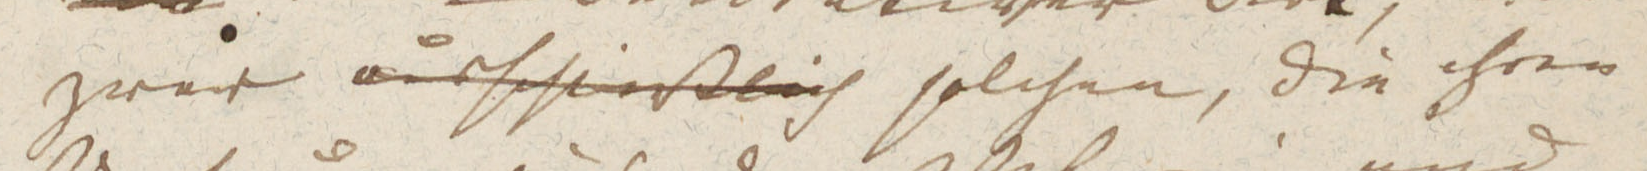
zwar ausschliesslich solchen, die ihren
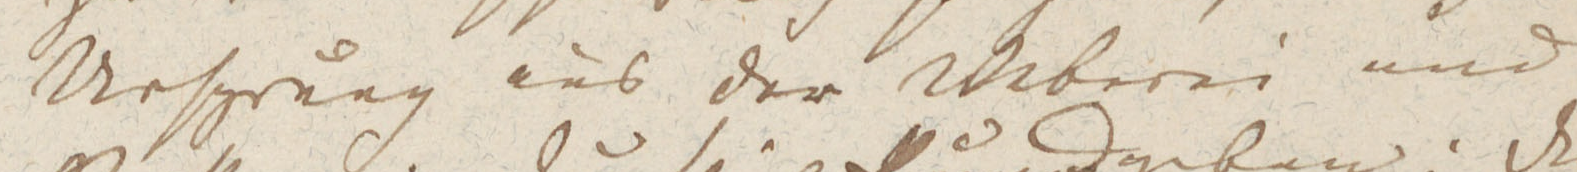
Ursprung aus der Weberei und
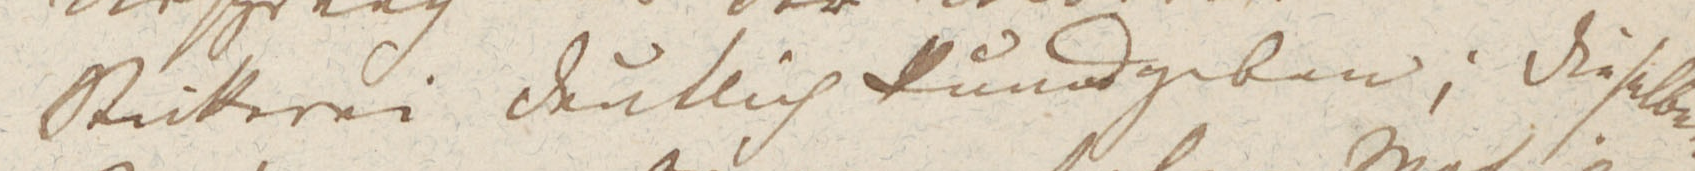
Stickerei deutlich kundgeben; Dieselben
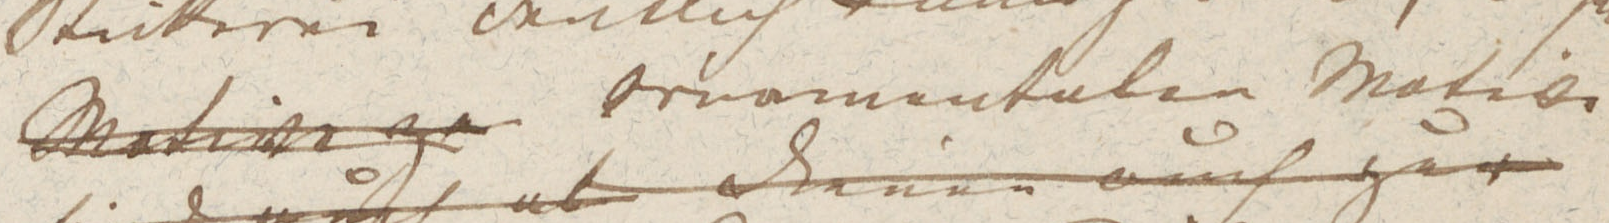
Motive z ornamentalen Motive
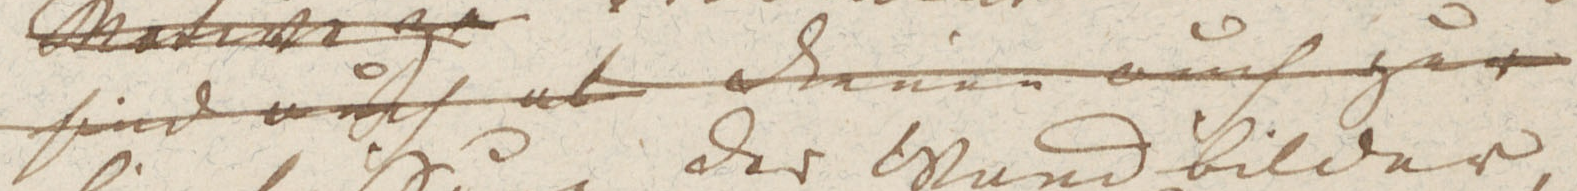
sind auch ob denen auch zur
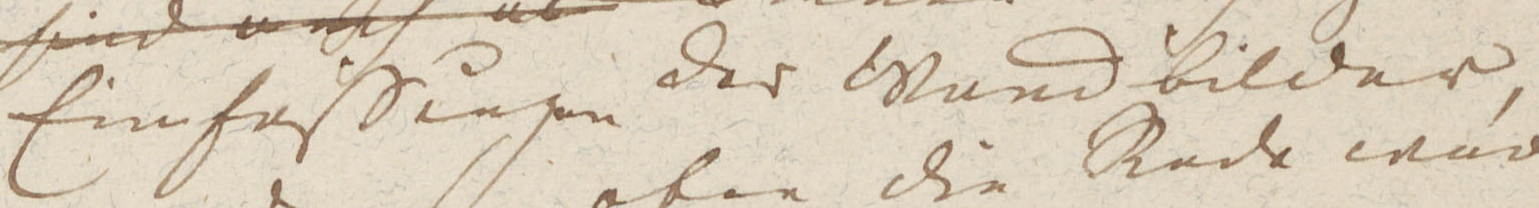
Einfassungen der Wandbilder,
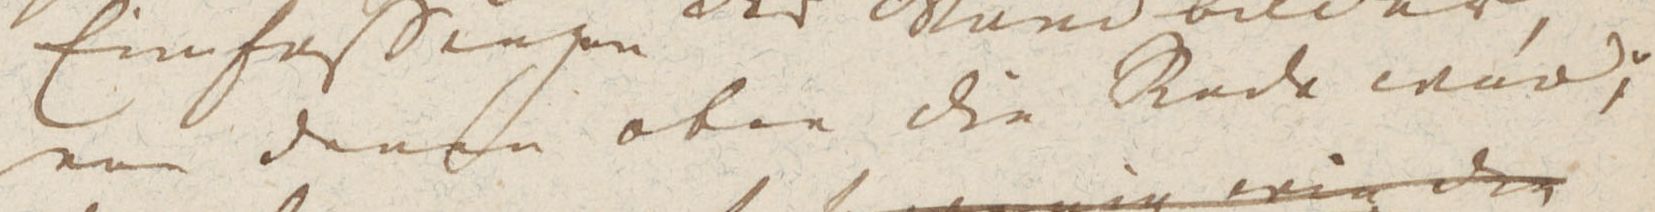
von denen oben die Rede war;
